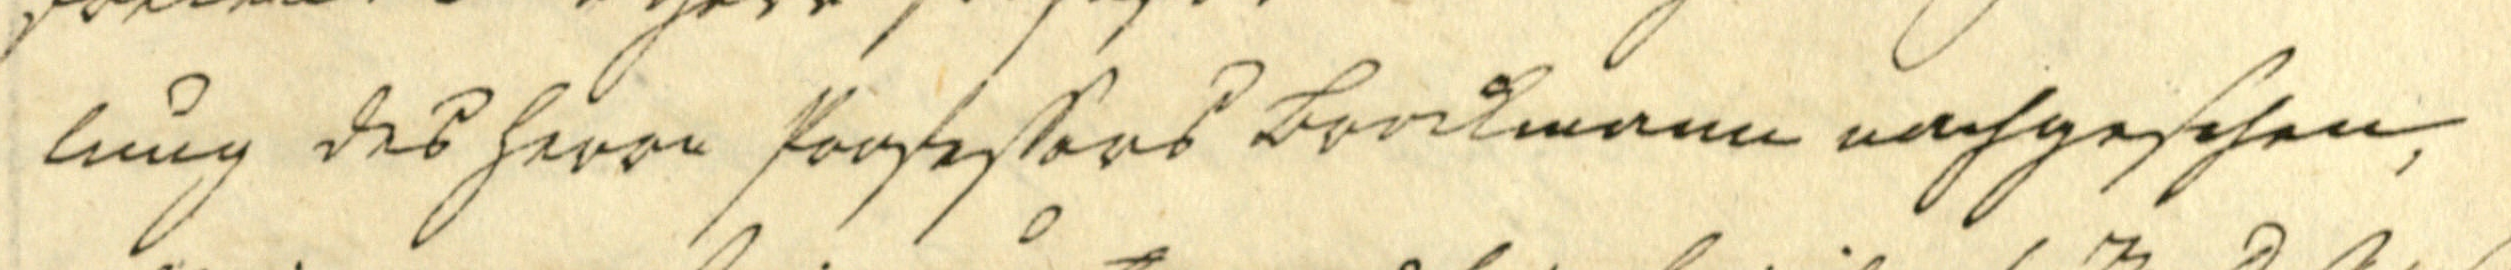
lung des Herrn Professors Brockmann nachgesehen,
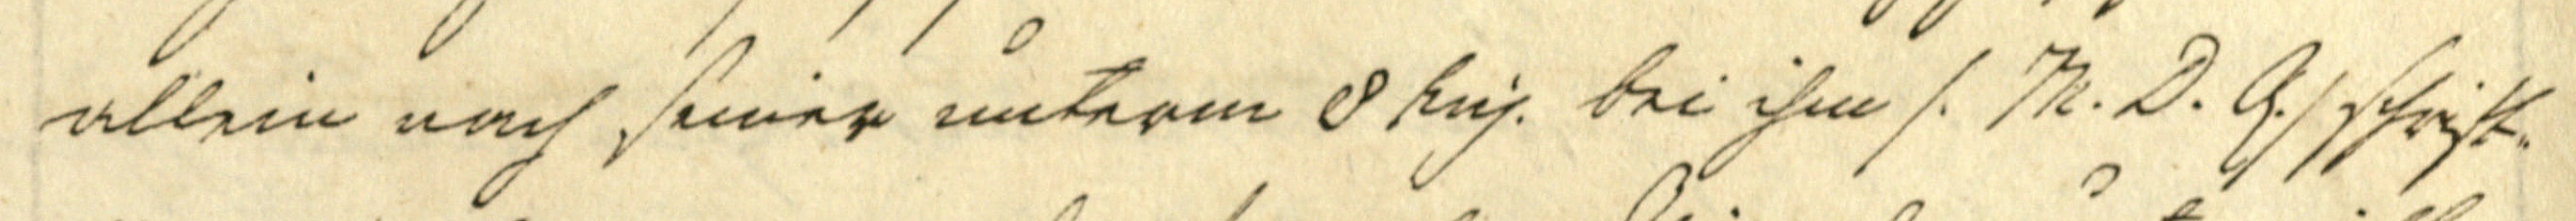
allein nach seiner unterm 8. huj. bei ihm /. M. D. R./ schrift¬
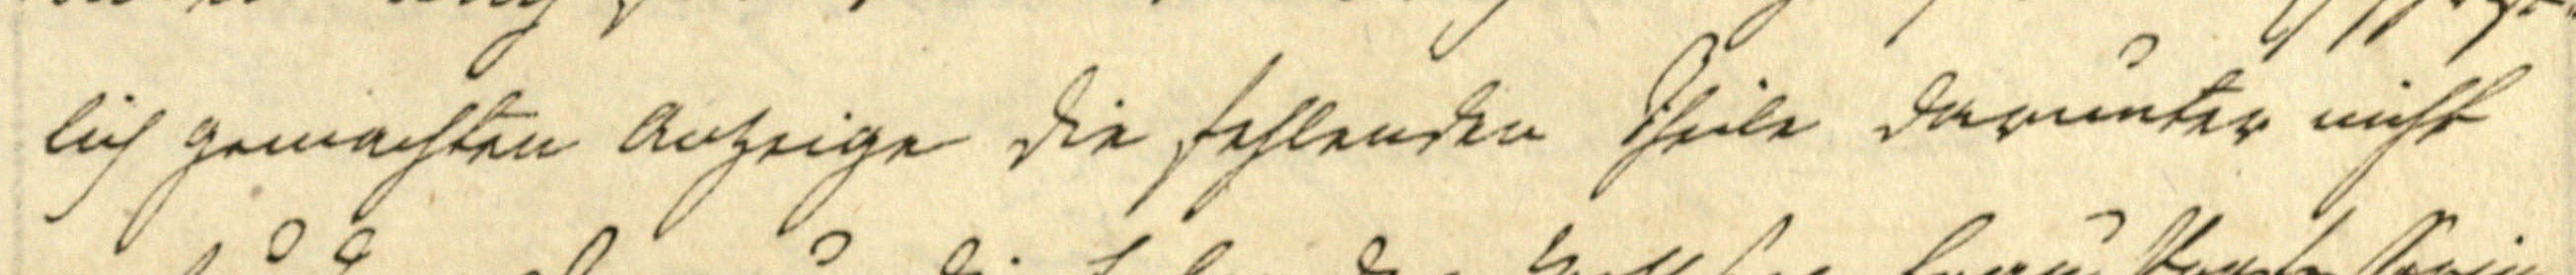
lich gemachten Anzeige die fehlenden Theile darunter nicht
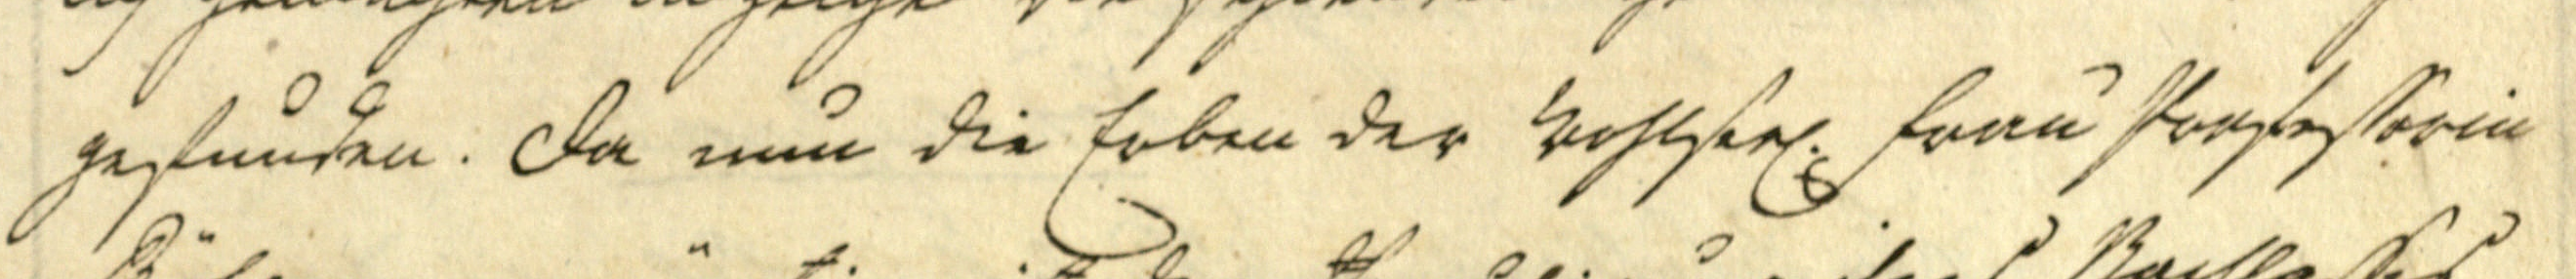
gefunden. Da nun die Erben der Wohlseel. Frau Professorin
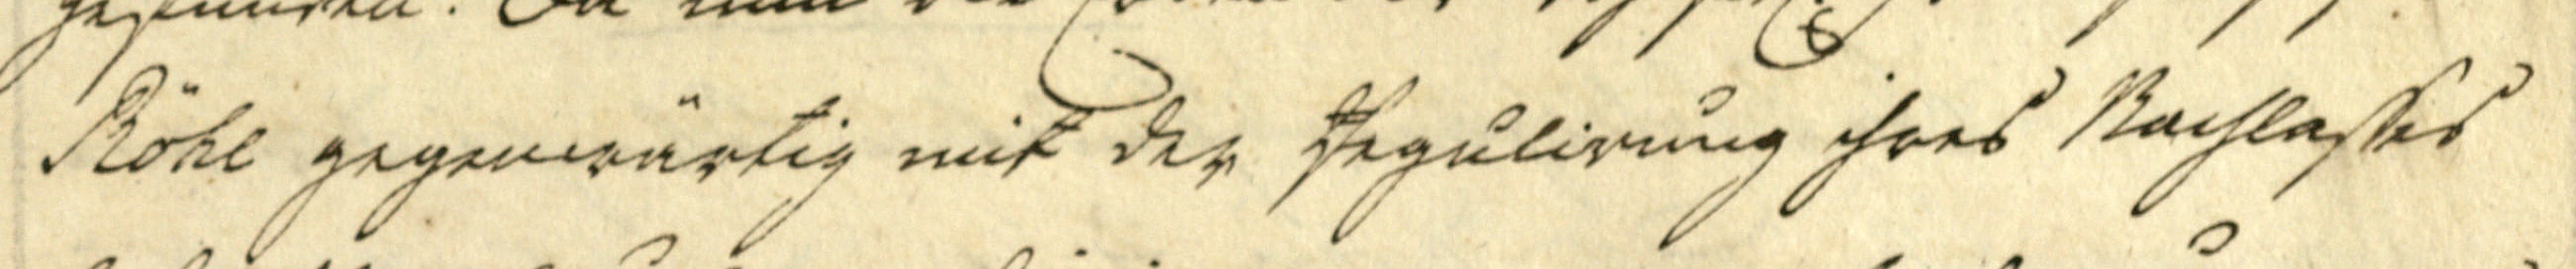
Röhl gegenwärtig mit der Regulirung ihres Nachlasses
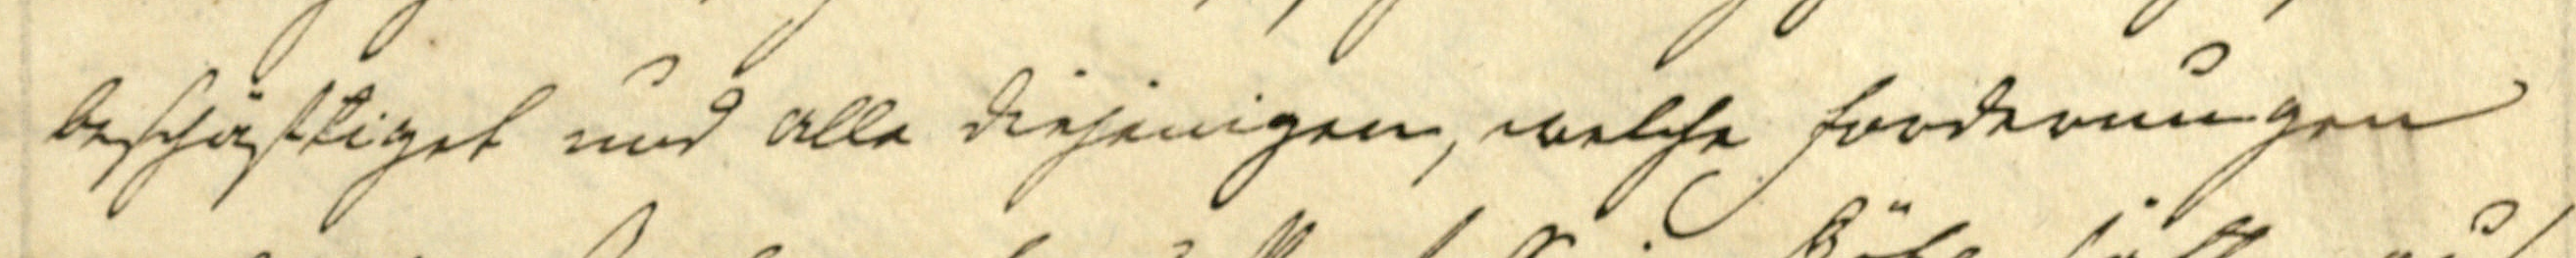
beschäftiget und alle diejenigen, welche Forderungen
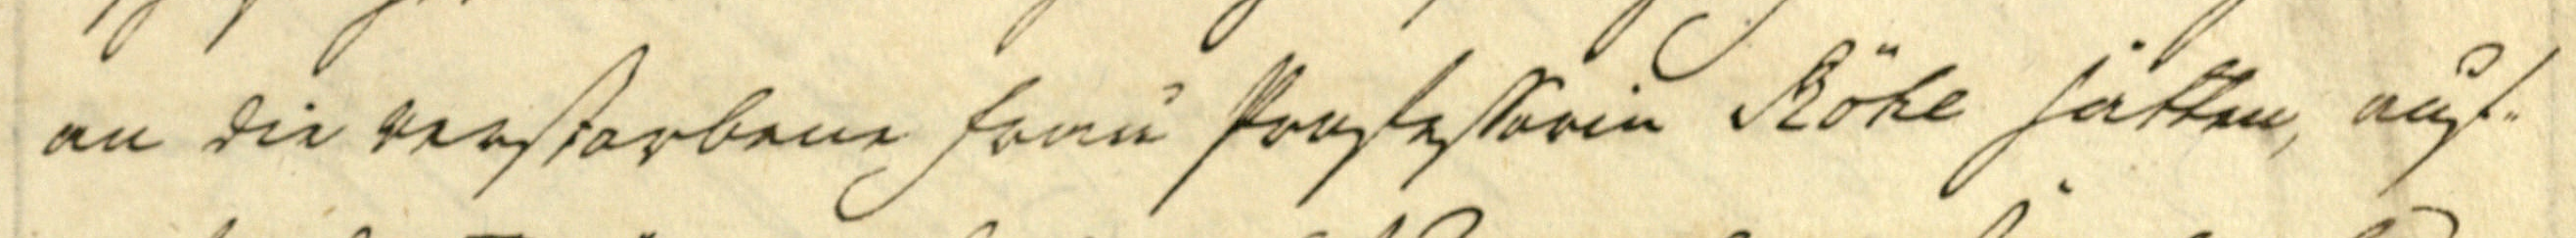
an die verstorbene Frau Professorin Röhl hätten, auf¬
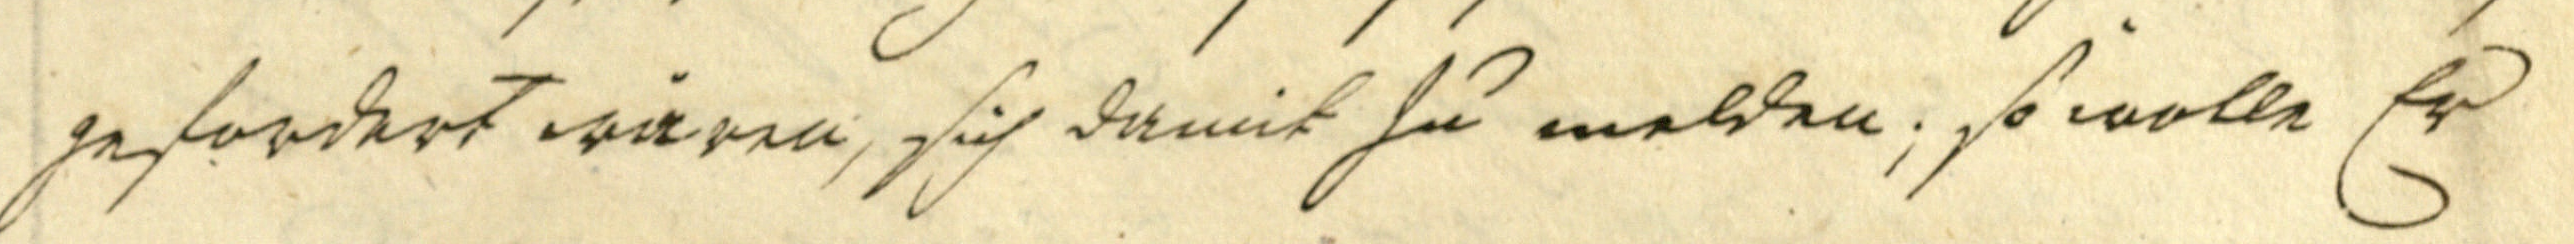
gefordert wären, sich damit zu melden; so wolle Er
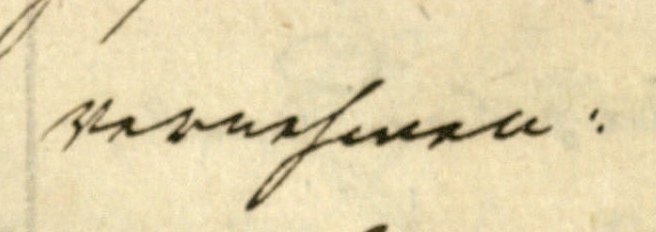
vernehmen:
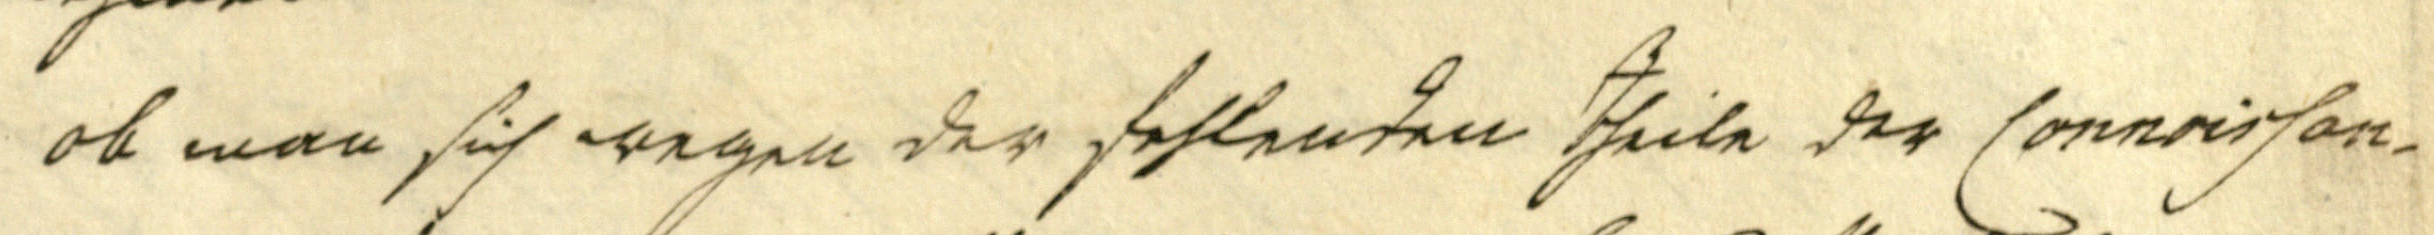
ob man sich wegen der fehlenden Theile der Connvisson¬
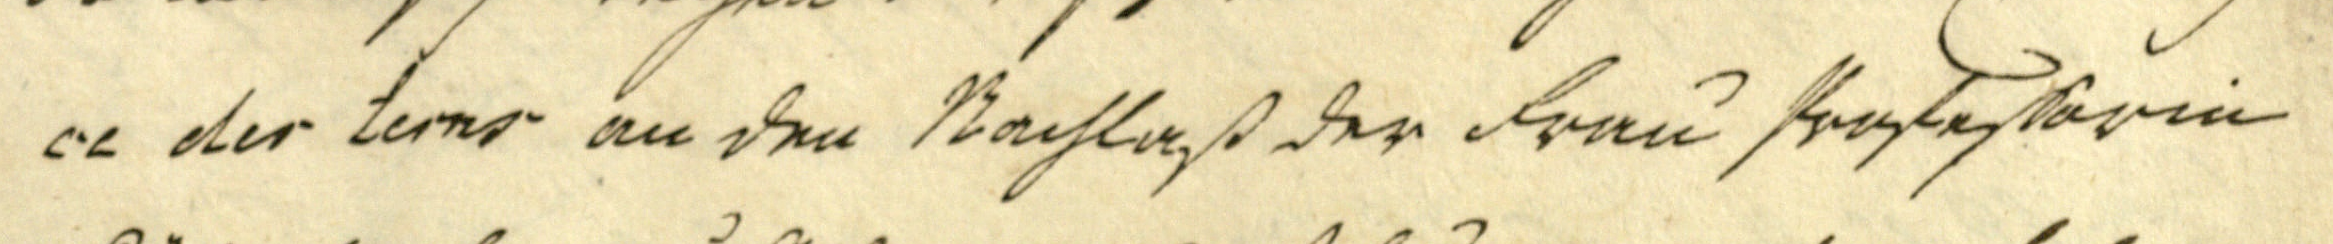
ce des terns an den Nachlaß der Frau Professorin
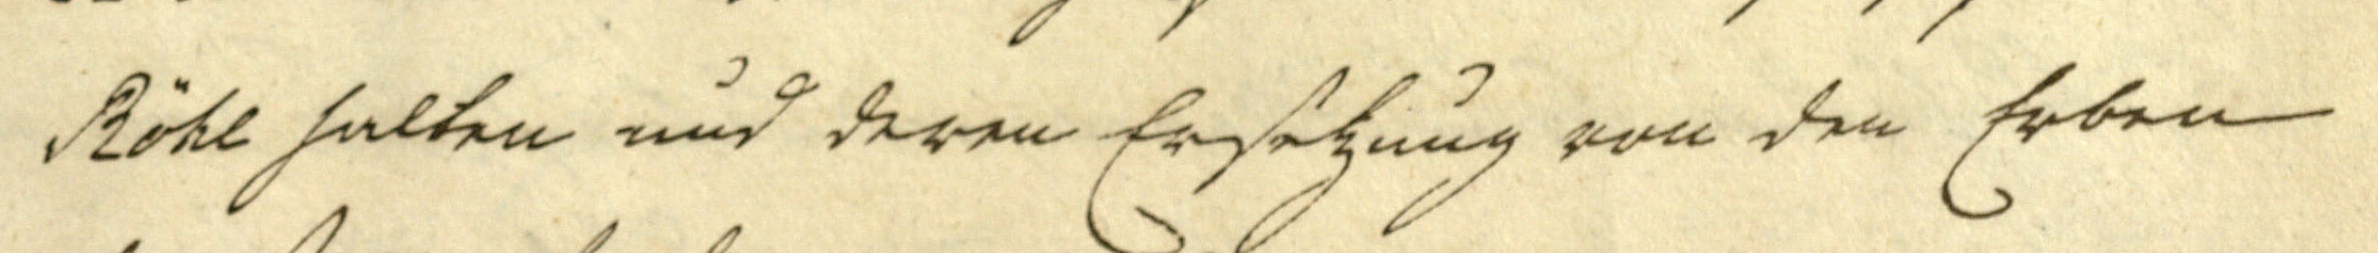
Röhl halten und deren Ersetzung von den Erben
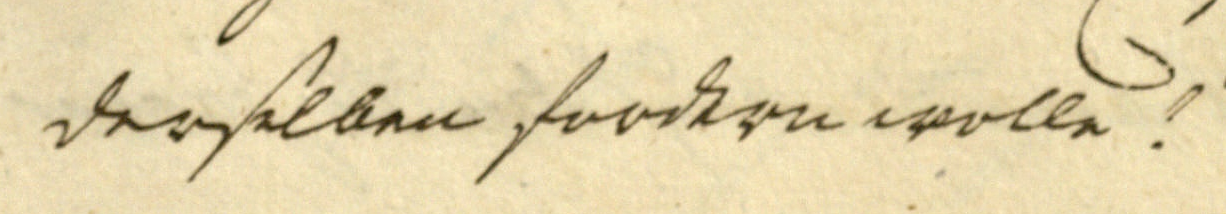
derselben fordern wolle?
